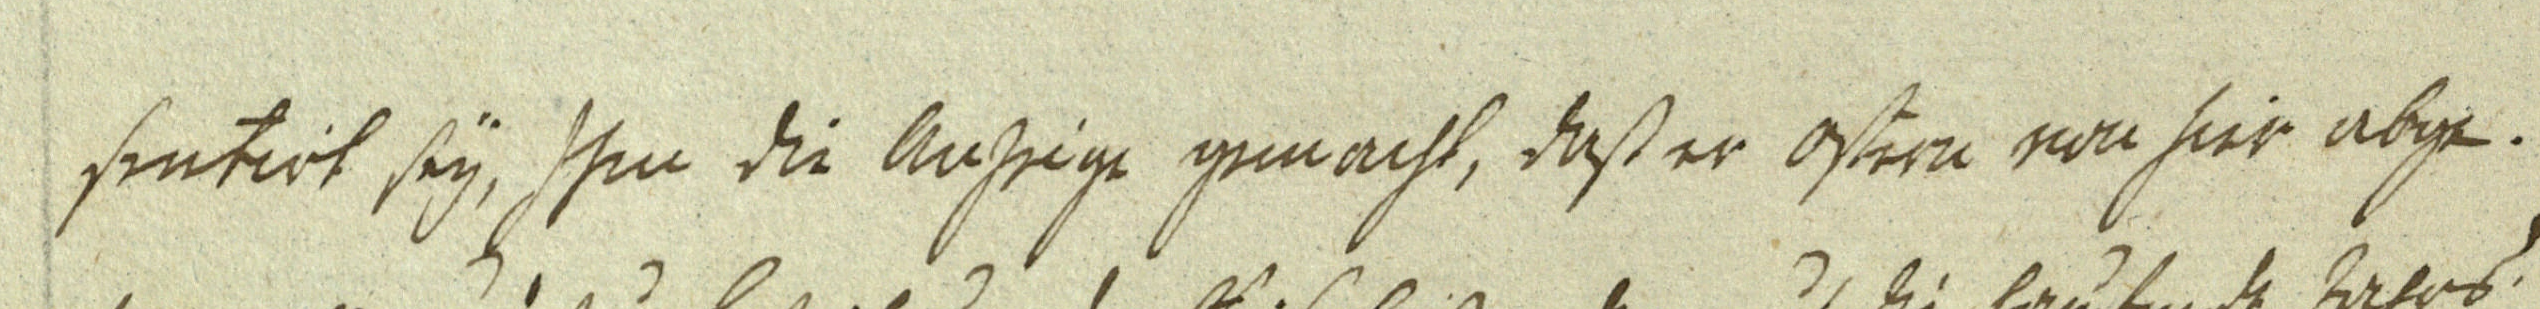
sentirt seÿ, dem die Anzeige gemacht, daß er Ostern von hier abge¬
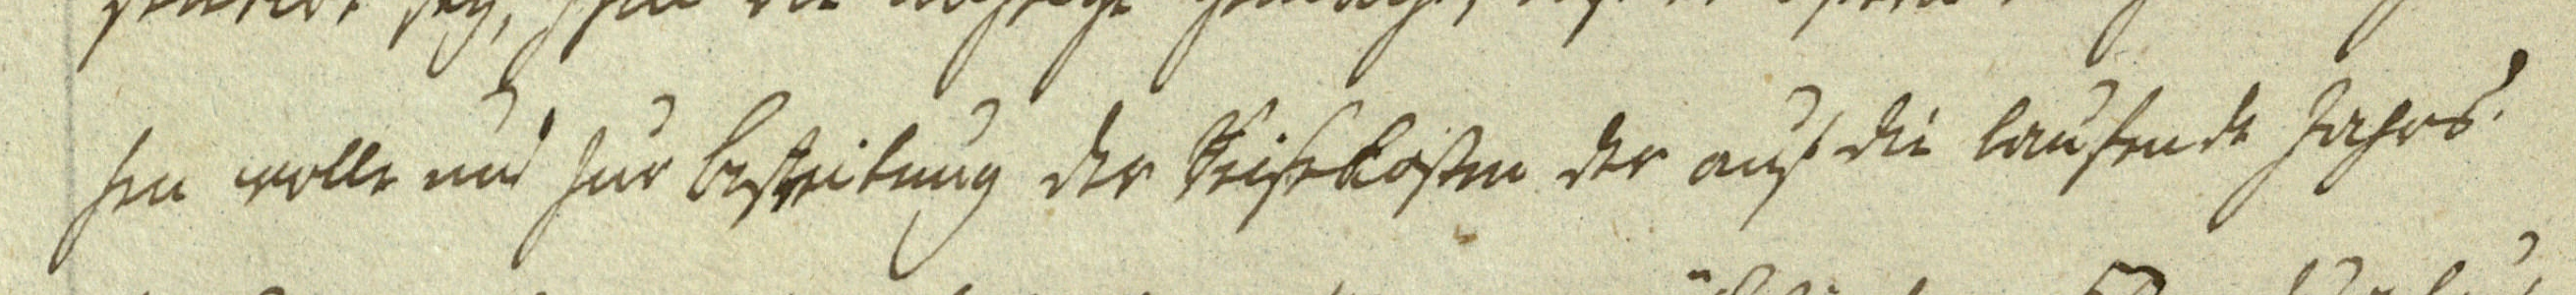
hen wolle und zur Bestreitung der Reisekosten der auf die laufende Jahrs¬
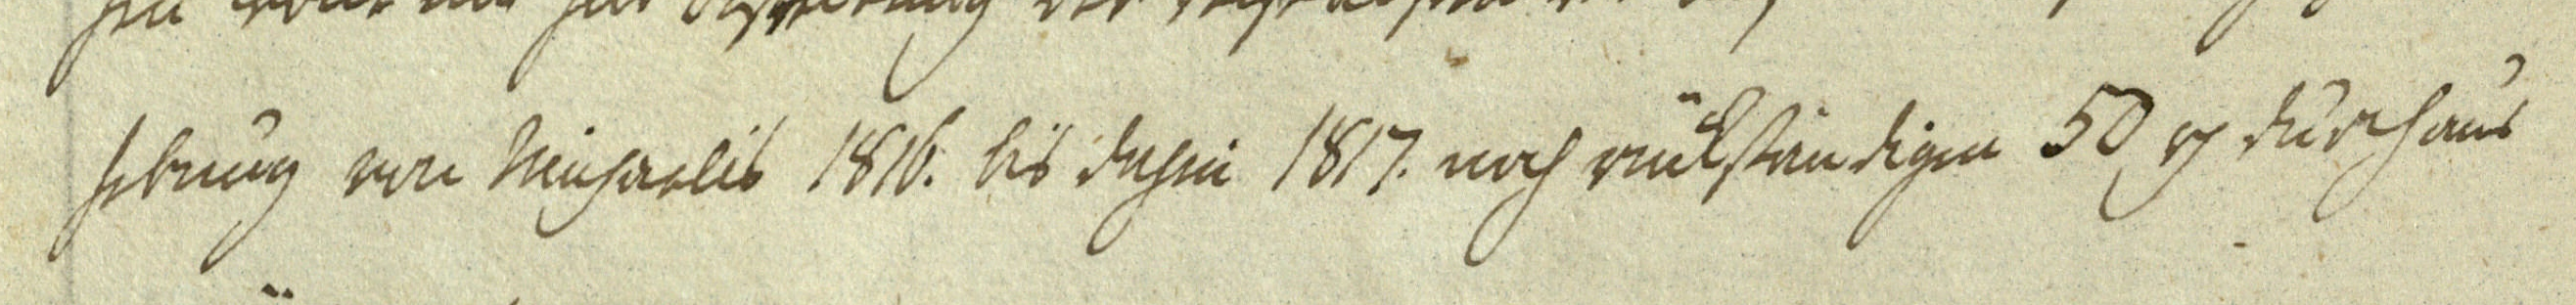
hebung von Michaelis 1816. bis dahin 1817. noch rückständigen 50 rt durchaus
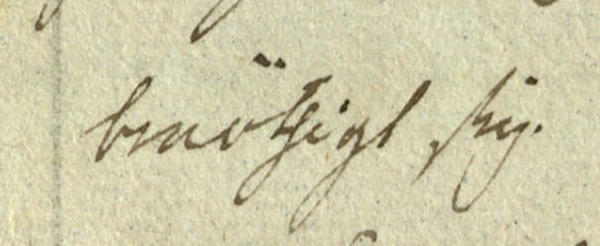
benöthigt seÿ.
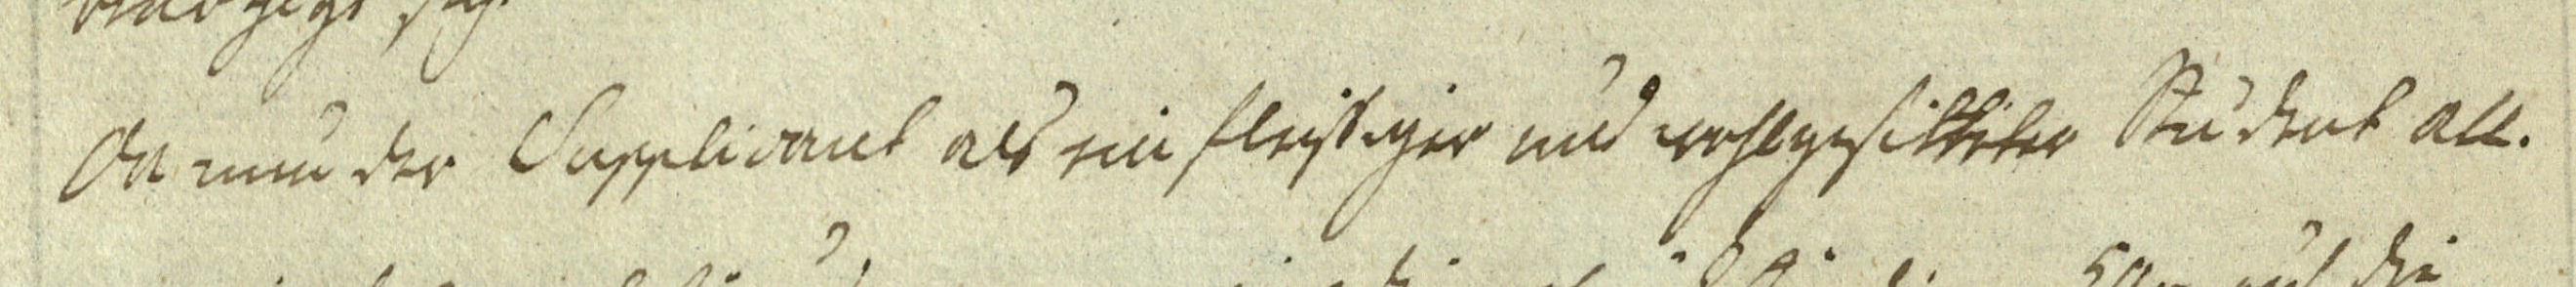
Da nun der Supplicant als ein fleissiger und wohlgesitteter Student all¬
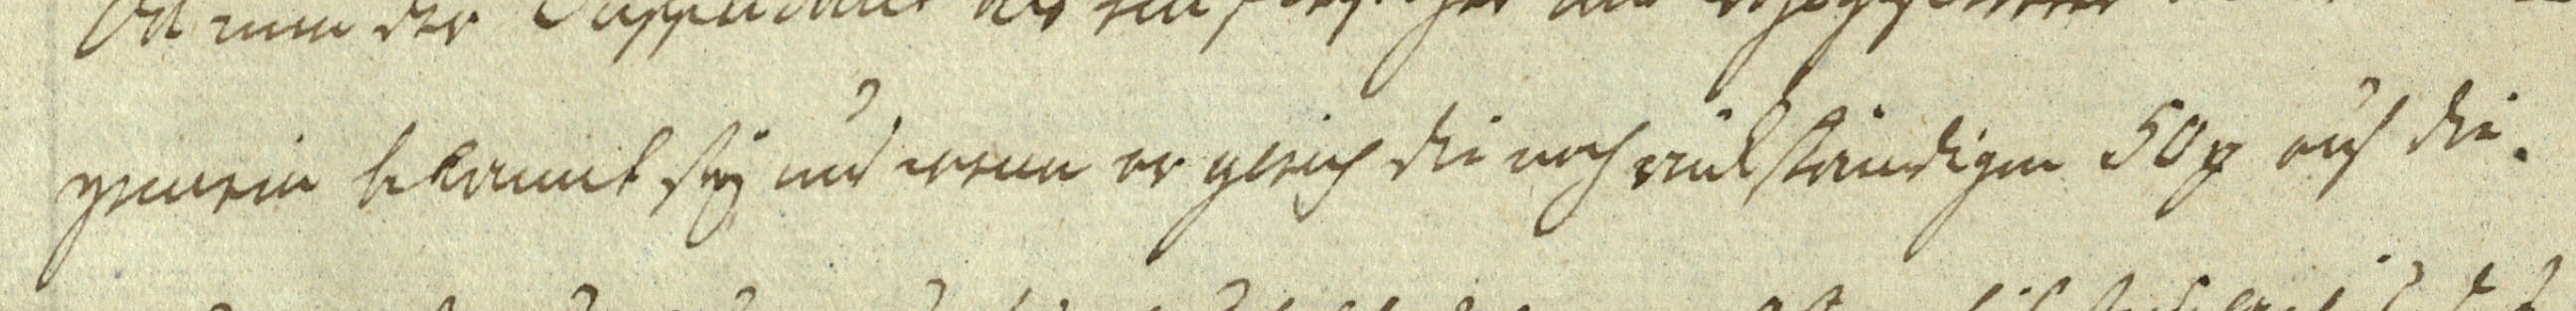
gemein bekannt seÿ und wenn er gleich die noch rückständigen 50 rt auf die
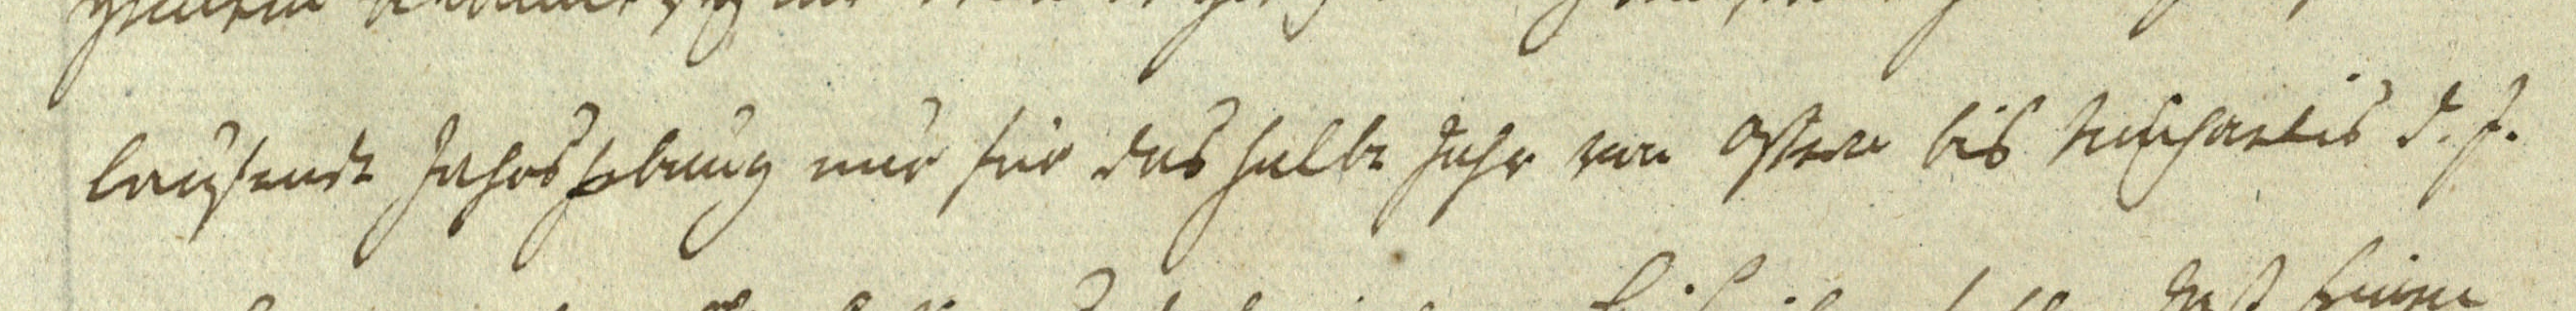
laufende Jahreshebung nur für das halbe Jahr von Ostern bis Michaelis d. J.
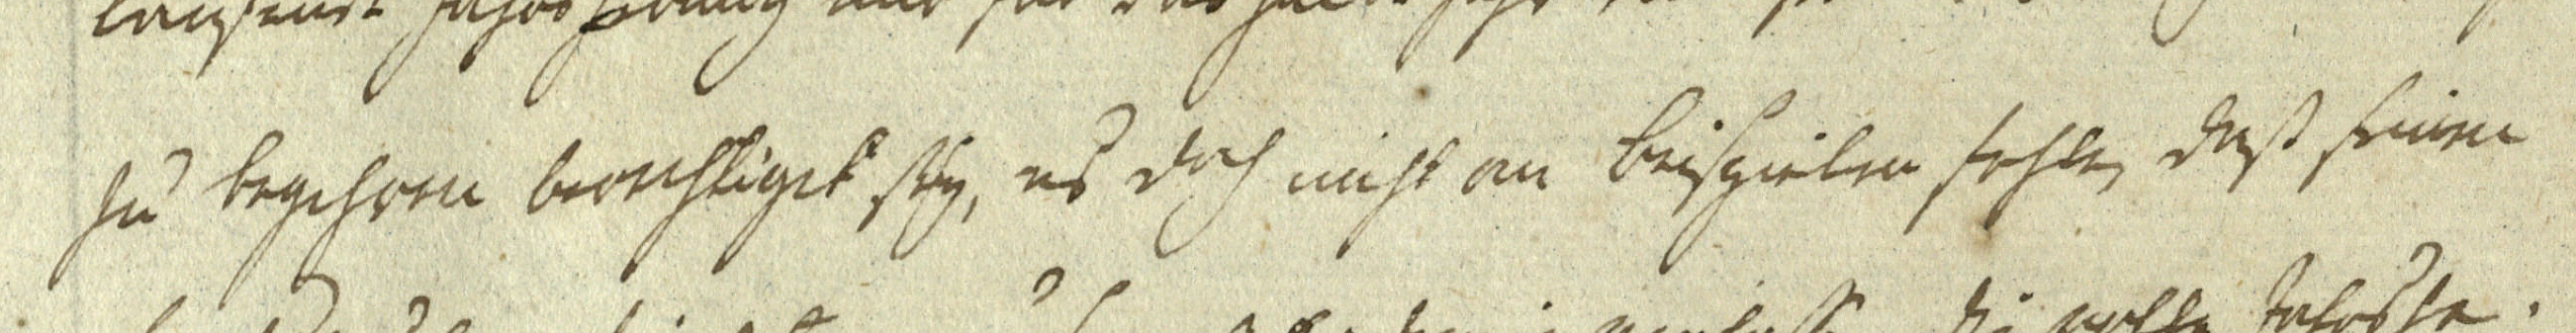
zu begehren berechtiget seÿ, es doch nicht an Beispielen fehle, daß seinen
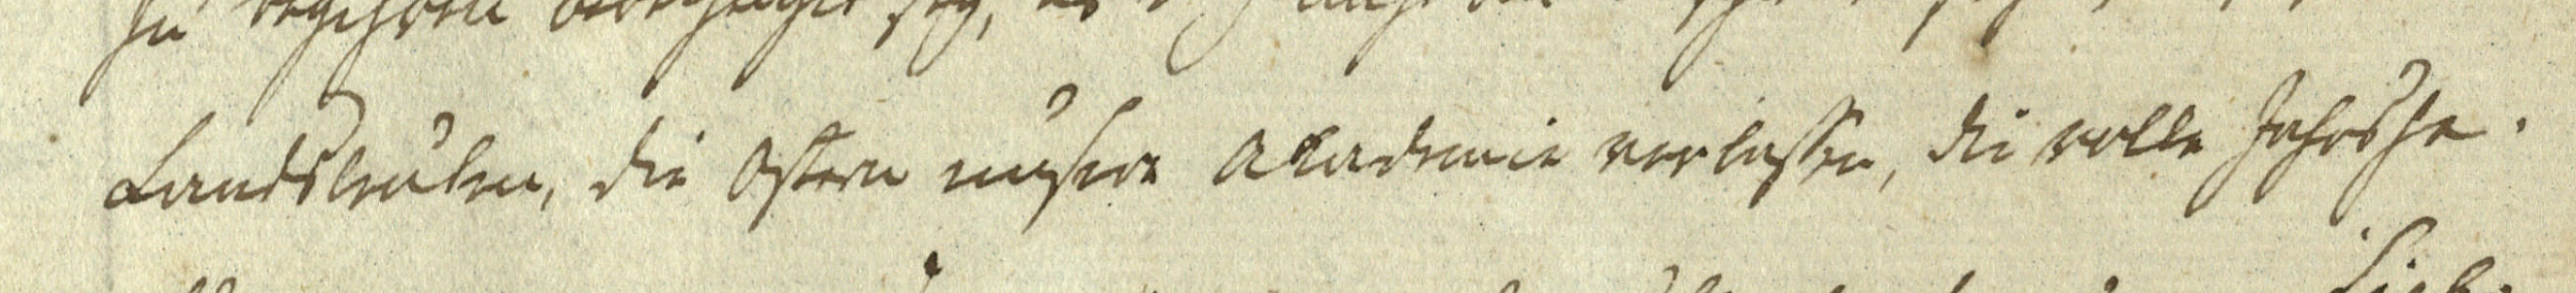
Landsleuten, die Ostern unsere Akademie verlassen, die volle Jahrshe¬
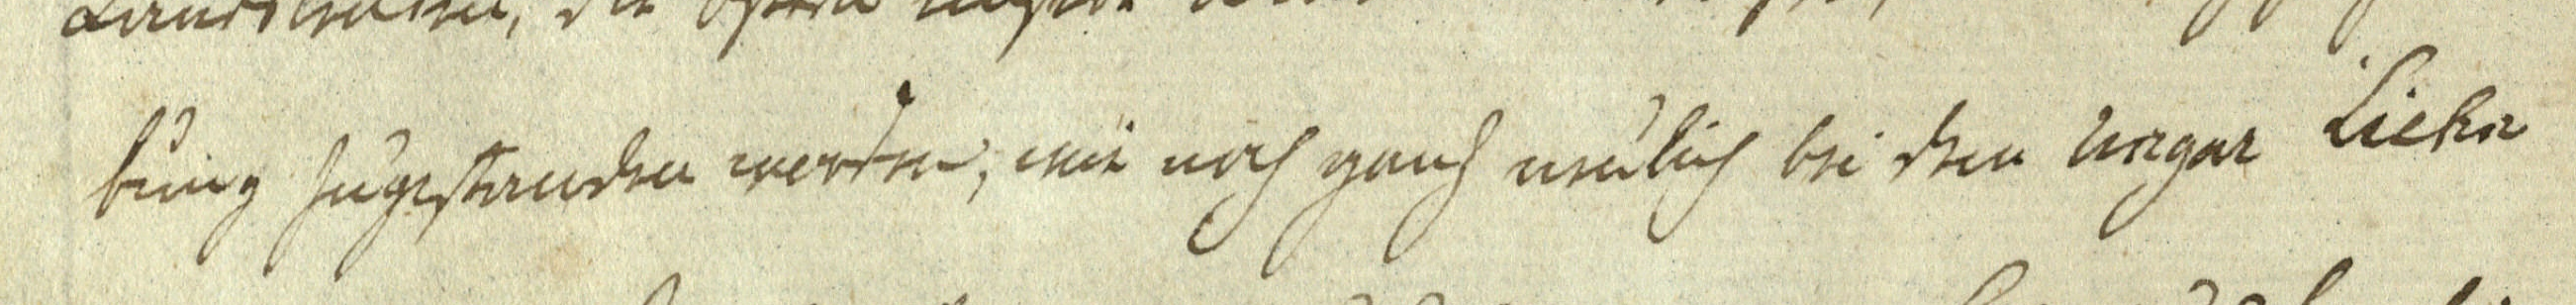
bung zugestanden worden, wie noch ganz neulich bei dem Ungar Liehn
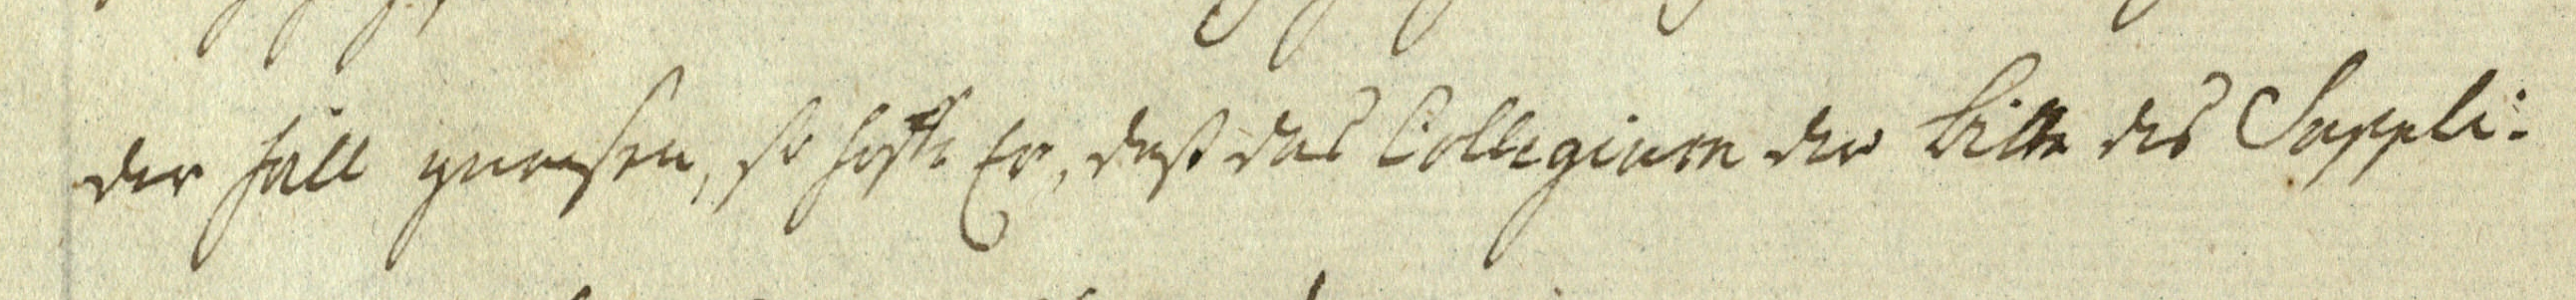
der Fall gewesen, so hoffe Er, daß das Collegium den Bitte des Suppli¬
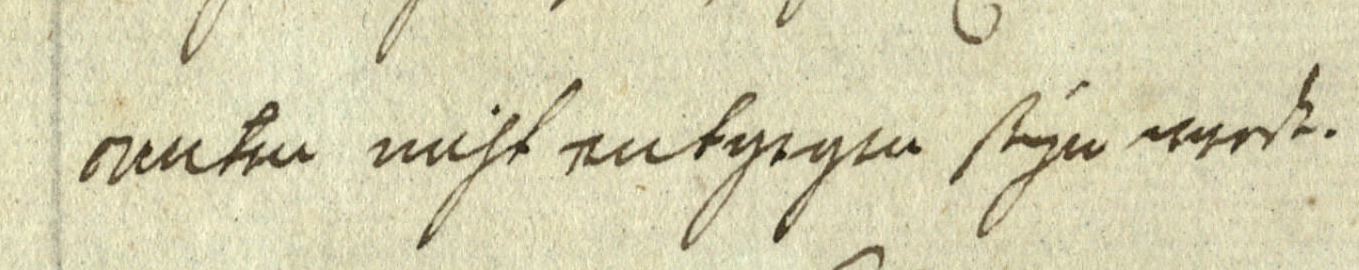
canten nicht entgegen seÿn werde.
